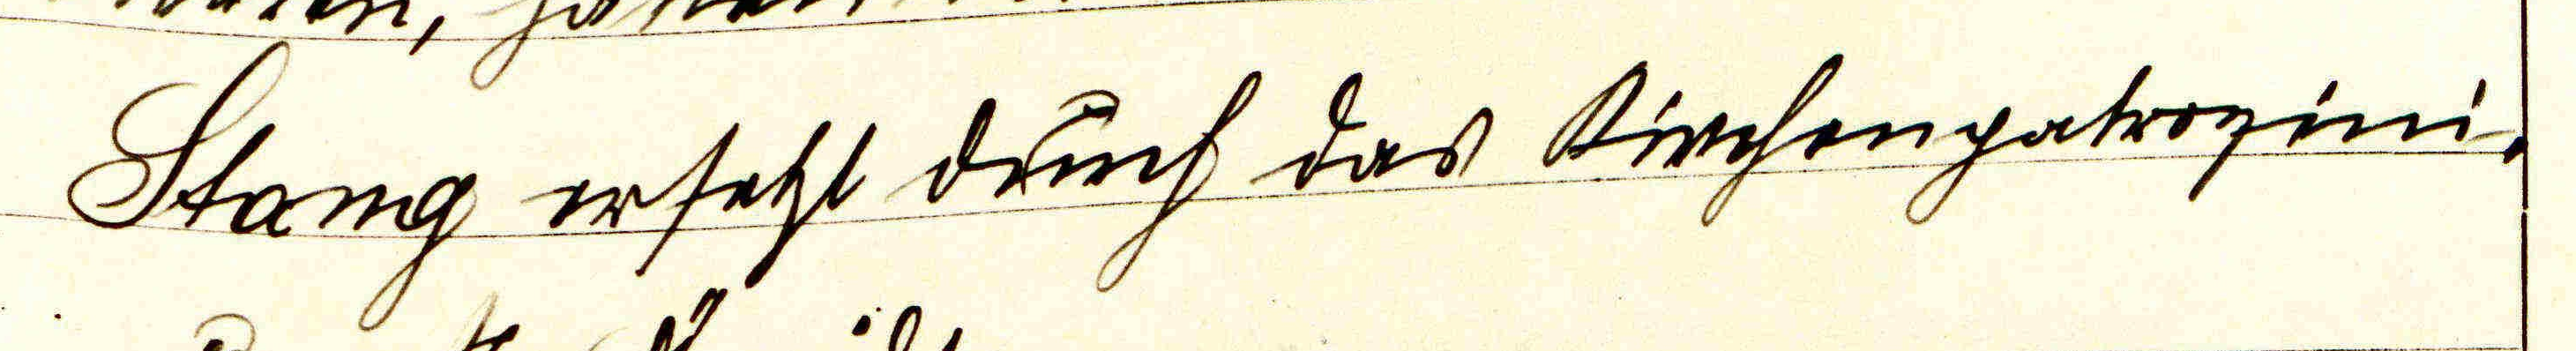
Stang ersetzt durch das Kirchenpatrozini-
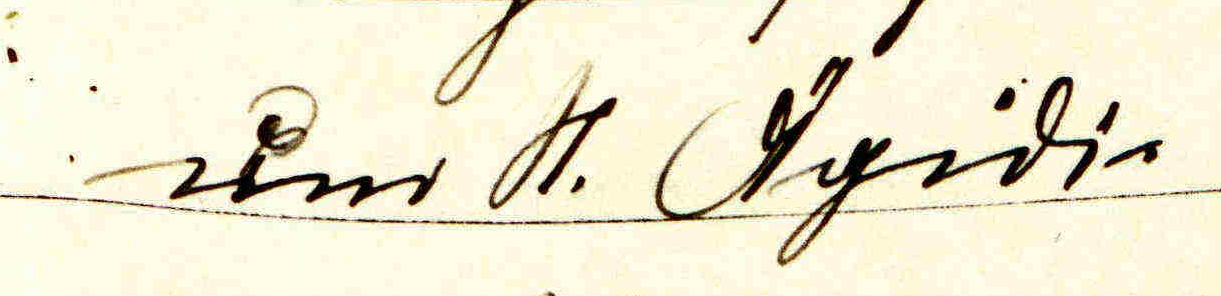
um St. Ägidi.
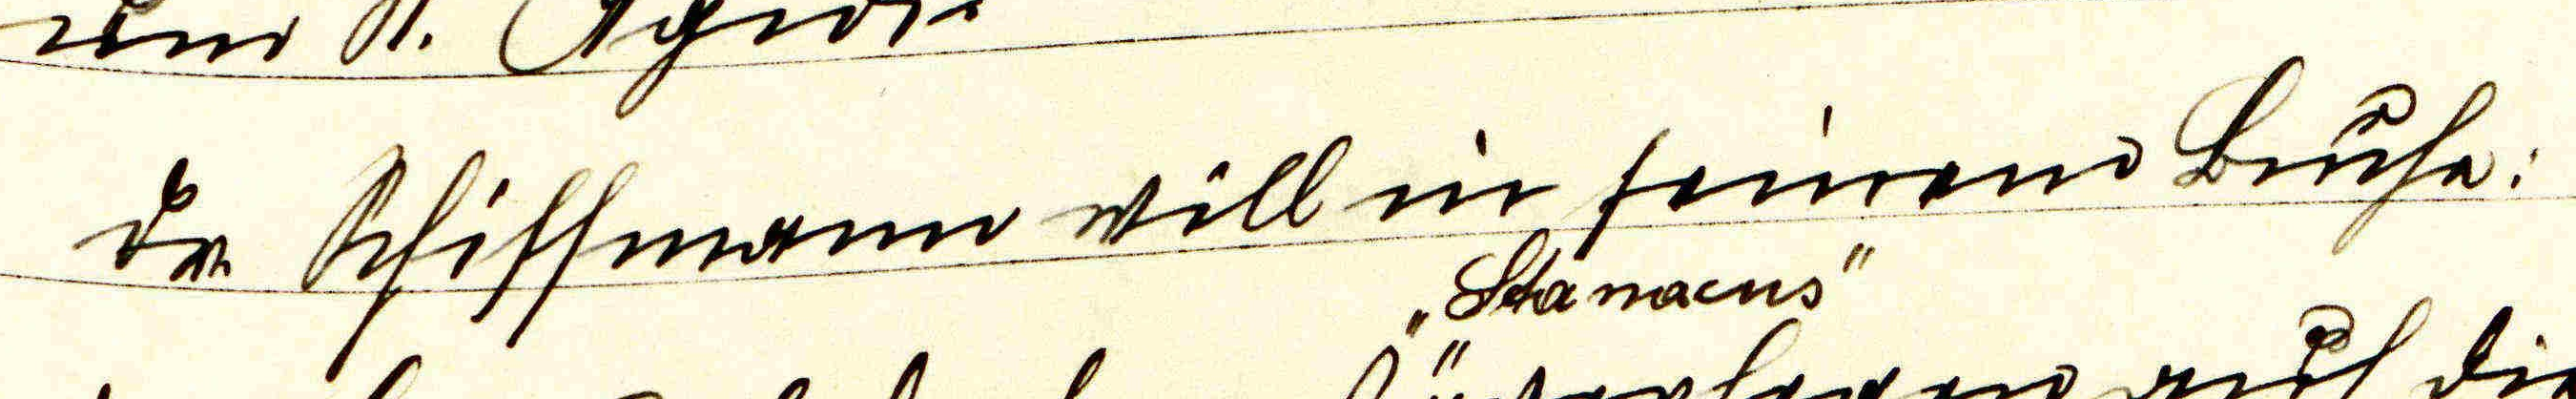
Dr. Schiffmann will in seinem Buche:
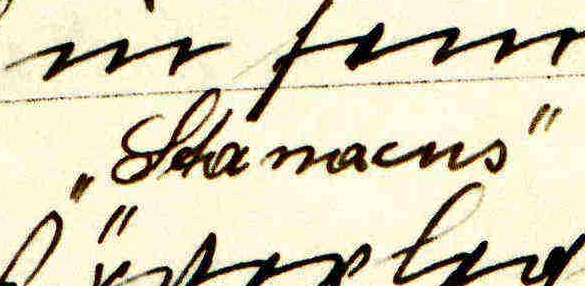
Stanacus
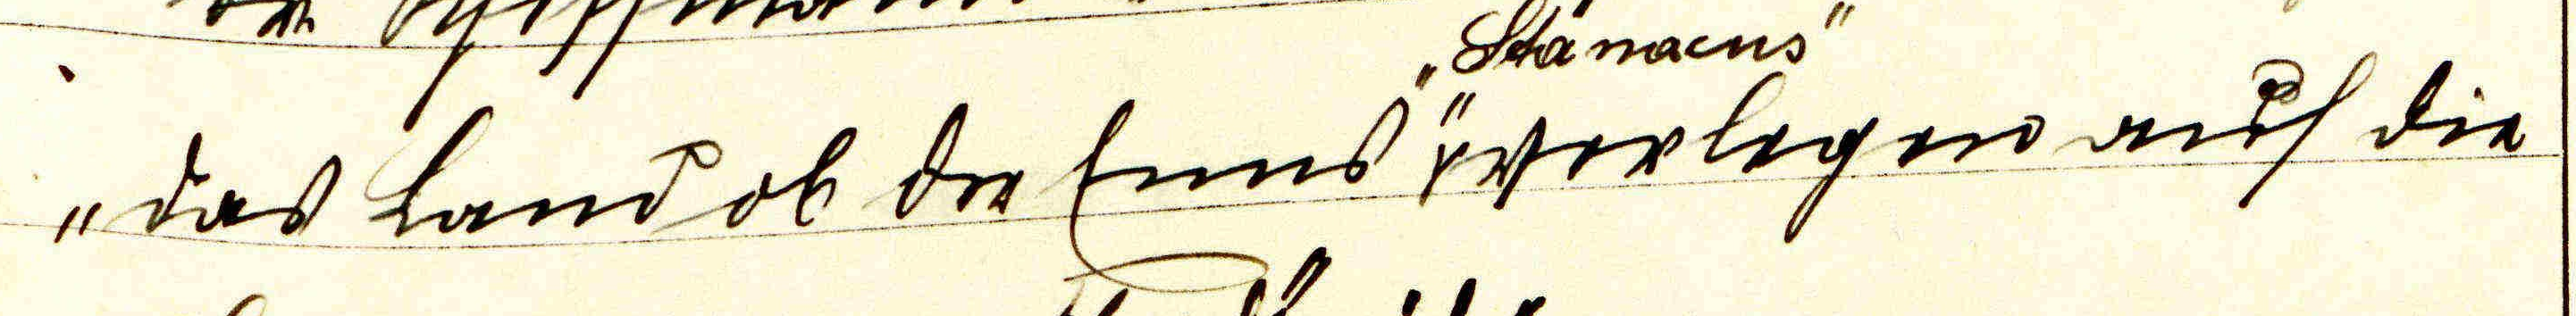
„das Land ob der Enns“ verlegen auf die
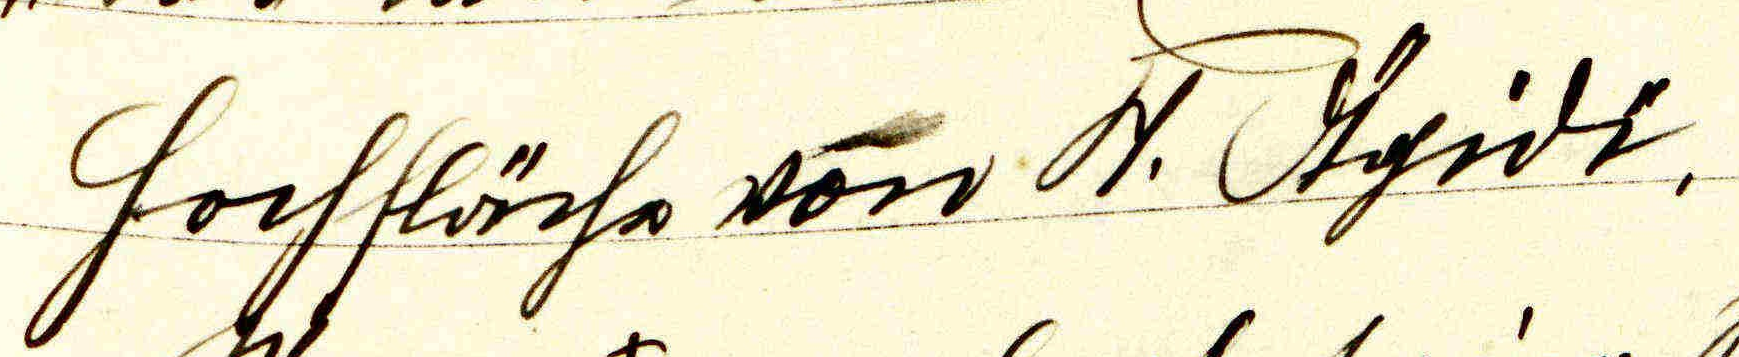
Hochfläche von St. Ägidi.
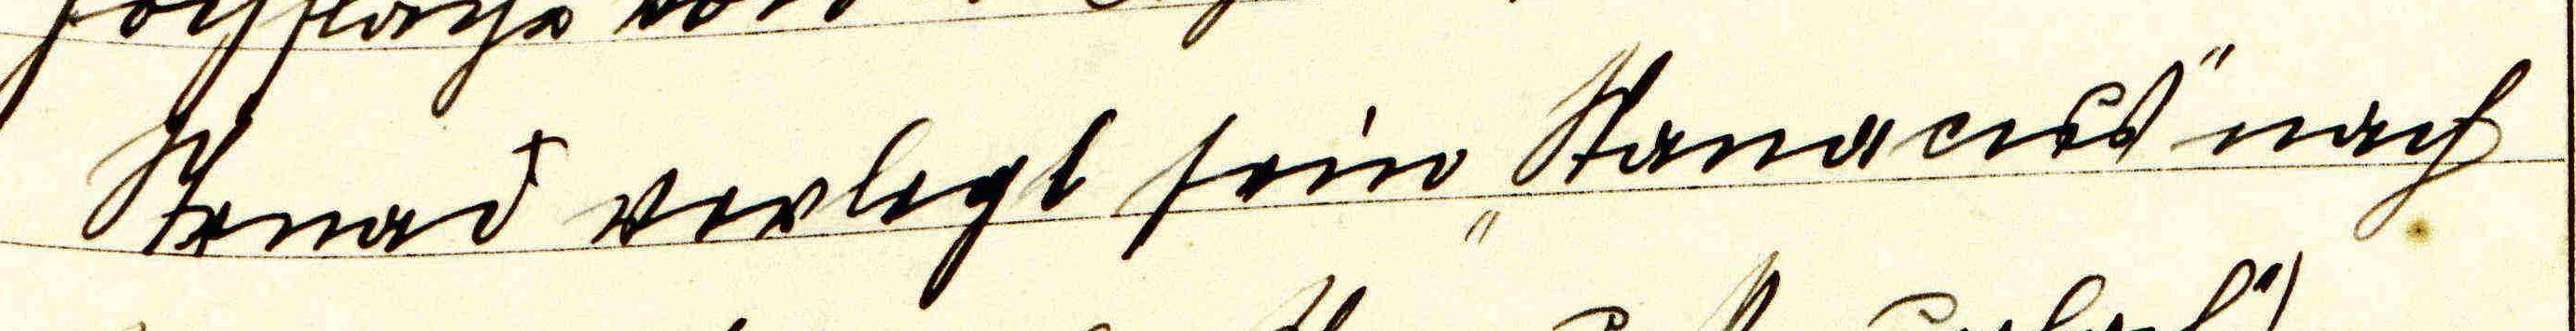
Strnad verlegt sein Stanacus nach
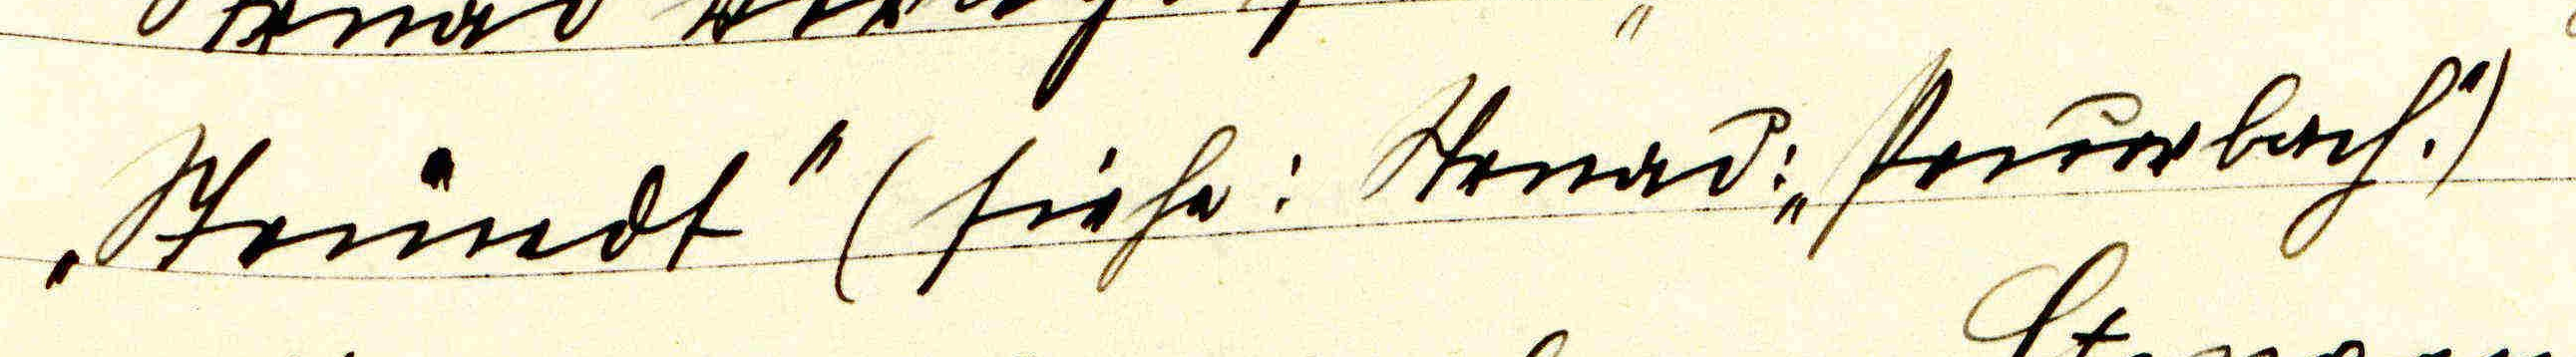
„Steinedt“ (siehe: Strnad; „Peuerbach“).
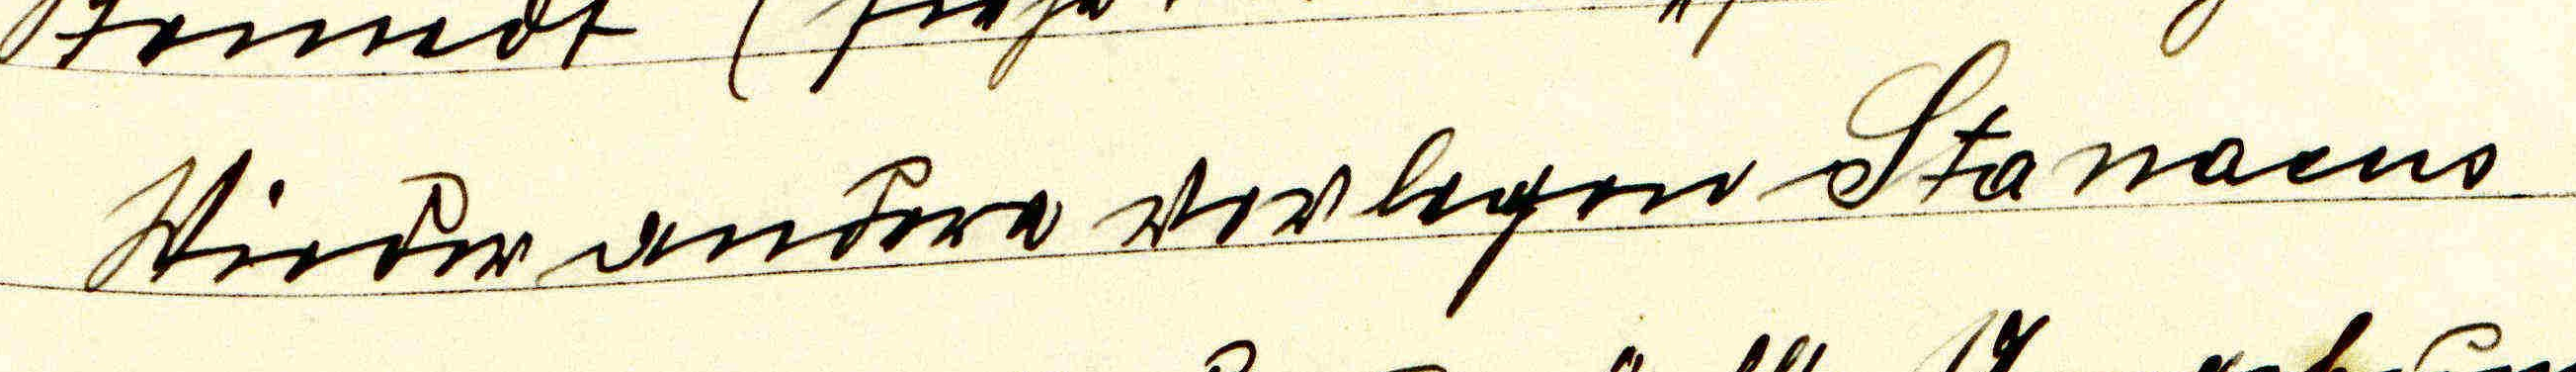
Wieder andere verlegen Stanacus
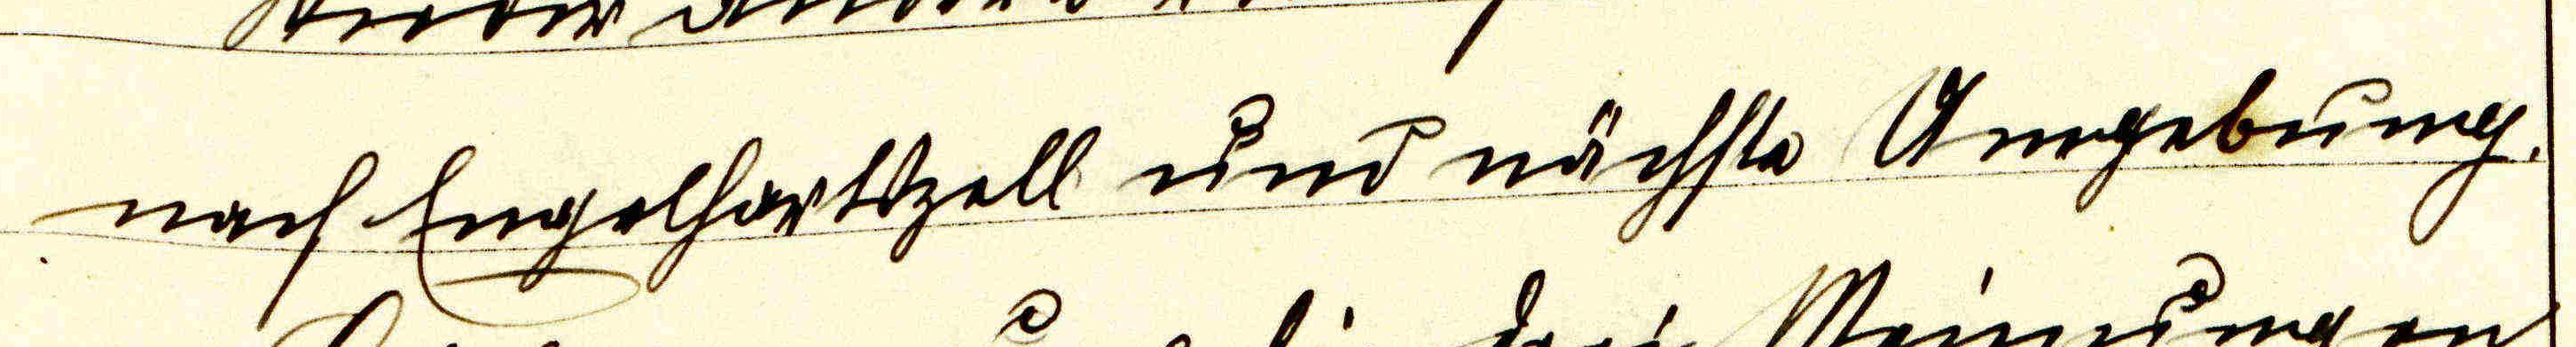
nach Engelhartszell und nächste Umgebung.
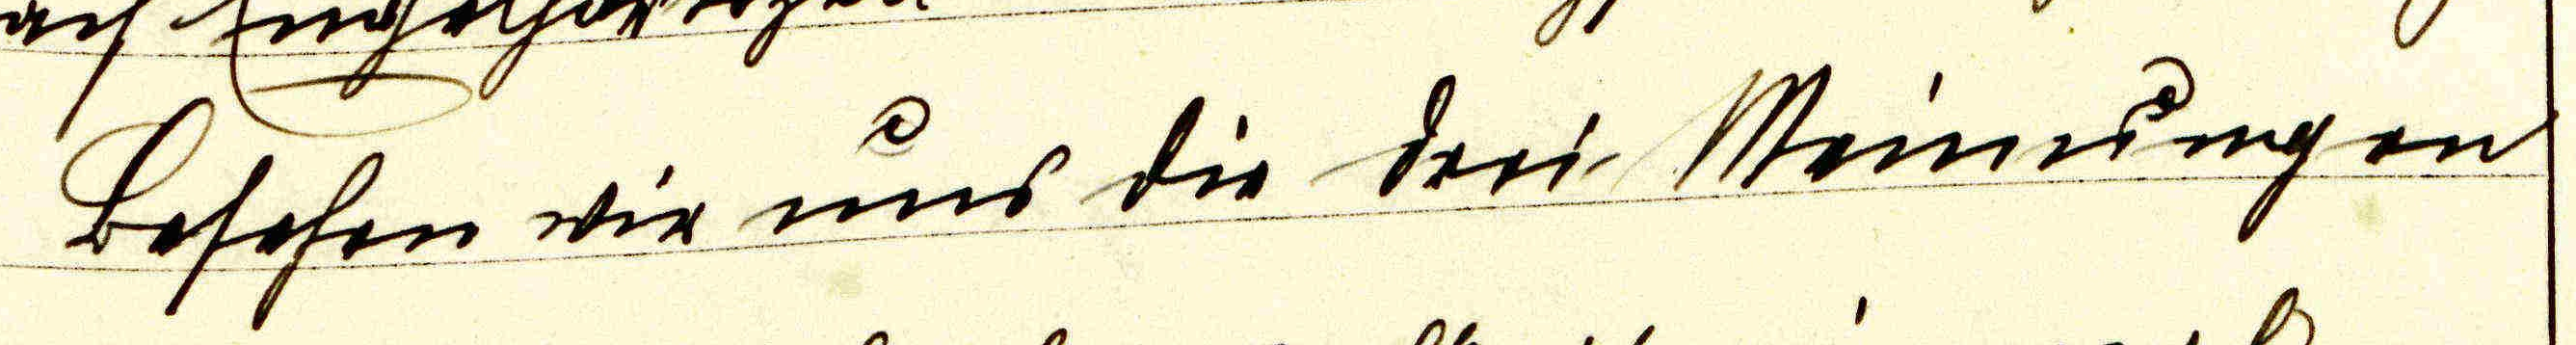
Besehen wir uns die drei Meinungen
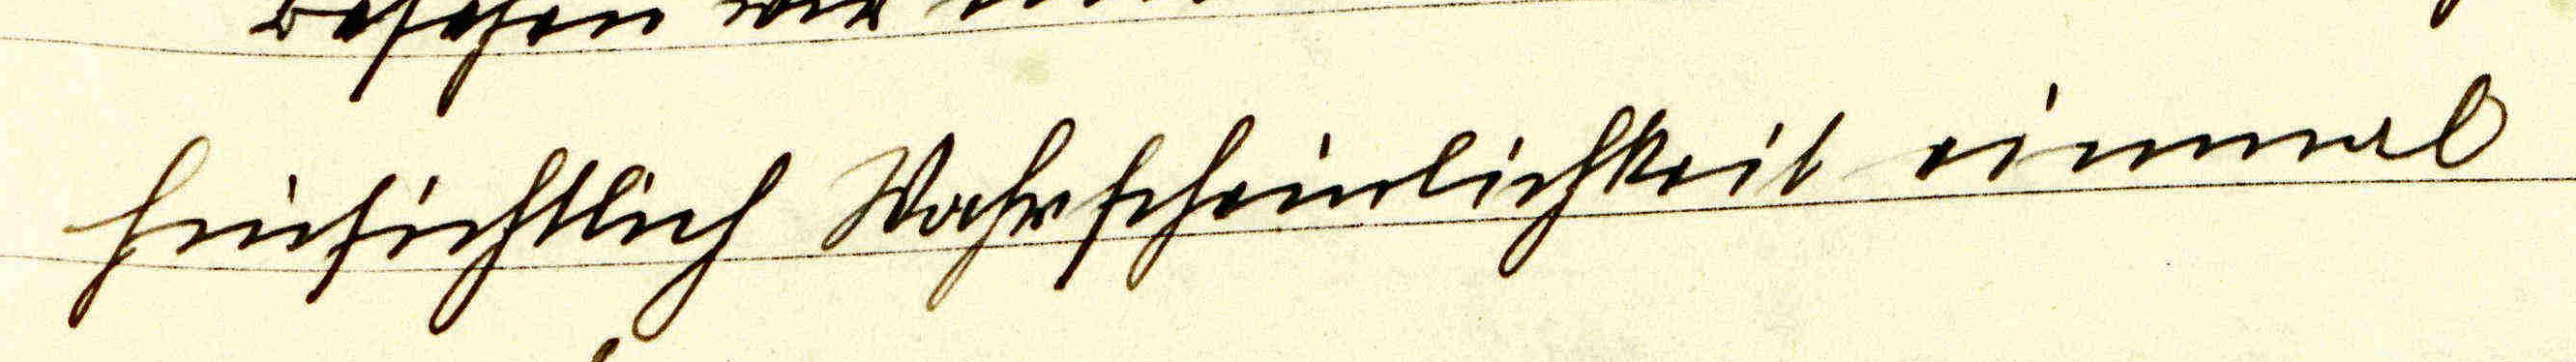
hinsichtlich Wahrscheinlichkeit einmal
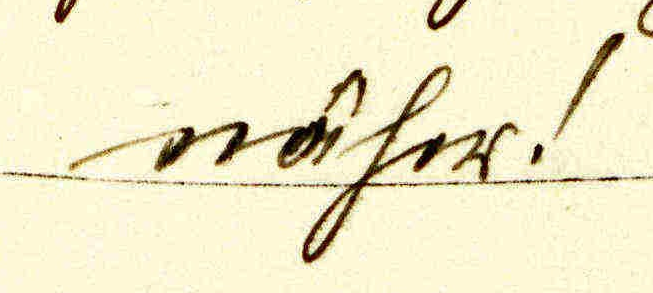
näher!
